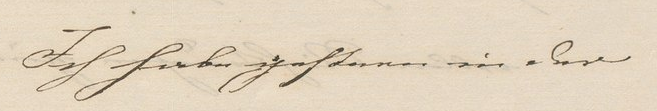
Ich habe gestern in der
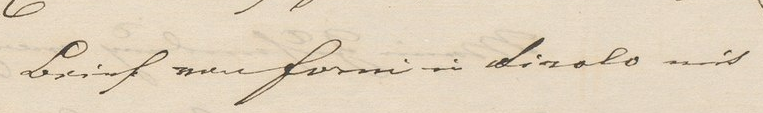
Brief von Forni in Airolo mit
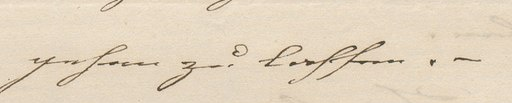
gehen zu lassen. –
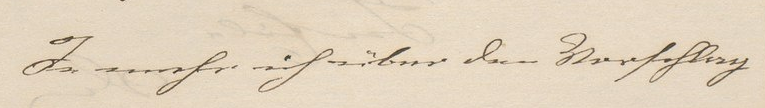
Je mehr ich über den Vorschlag
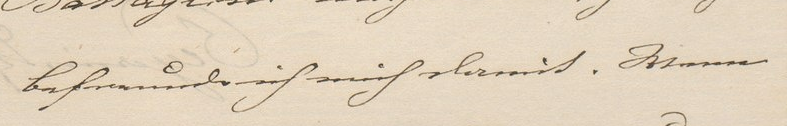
befreunde ich mich damit. Wenn
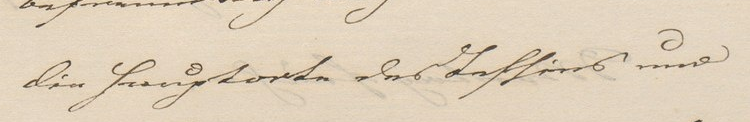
die Hauptorte des Tessins und
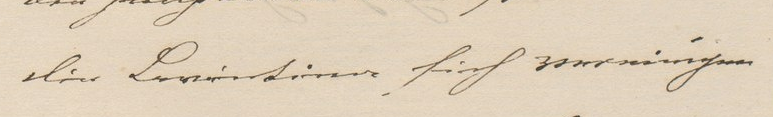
die Leventina sich vereinigen
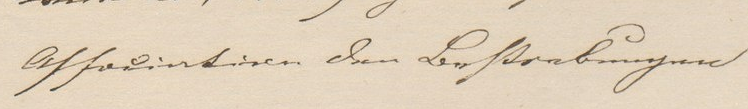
Association den Bestrebungen
